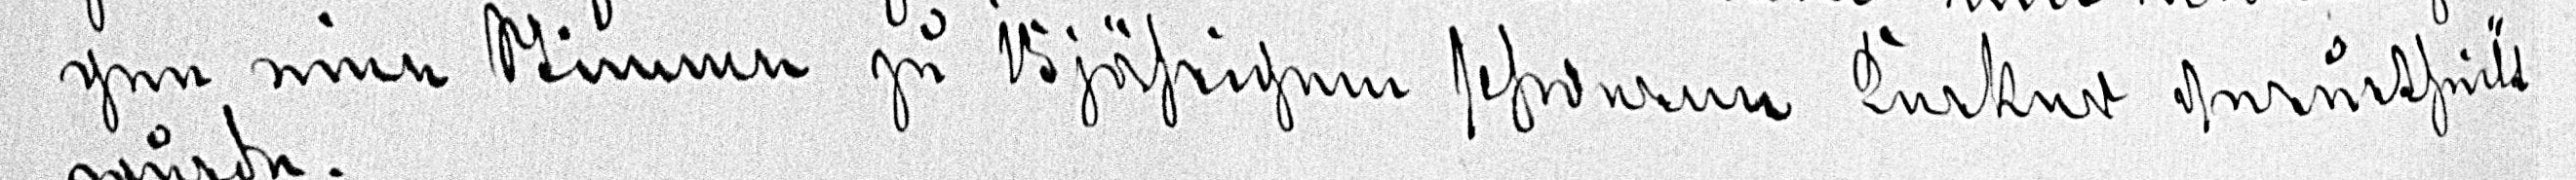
gen eine Stimme zu 15jährigem schweren Kerker verurtheilt
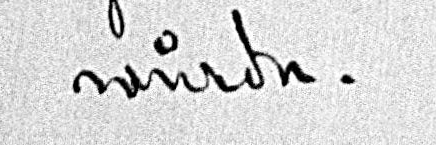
wurde.
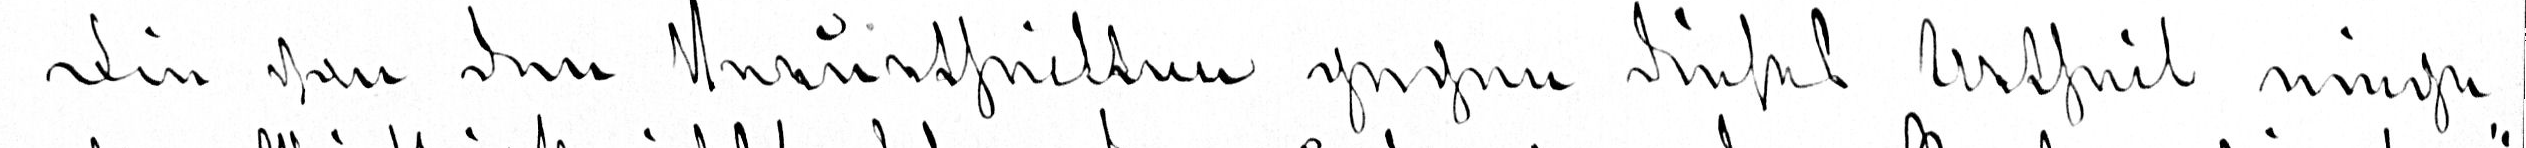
Die von den Verurtheilten gegen dieses Urtheil einge¬
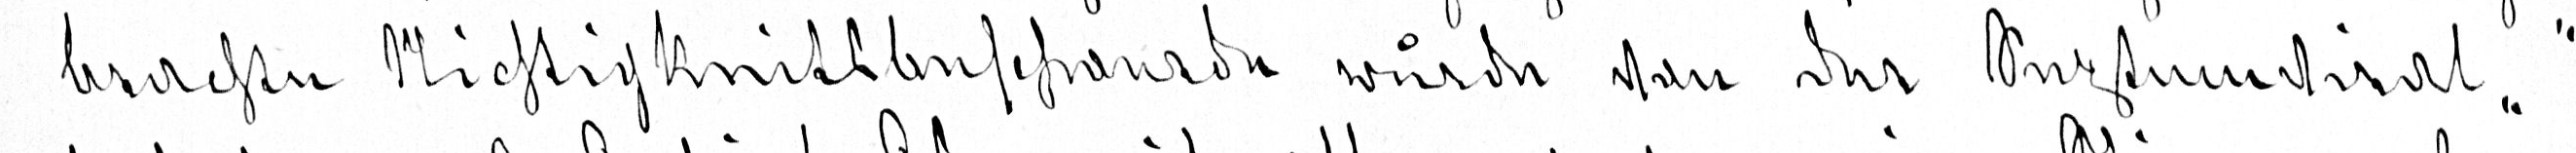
brachte Nichtigkeitsbeschwerde wurde von der Septemviral¬
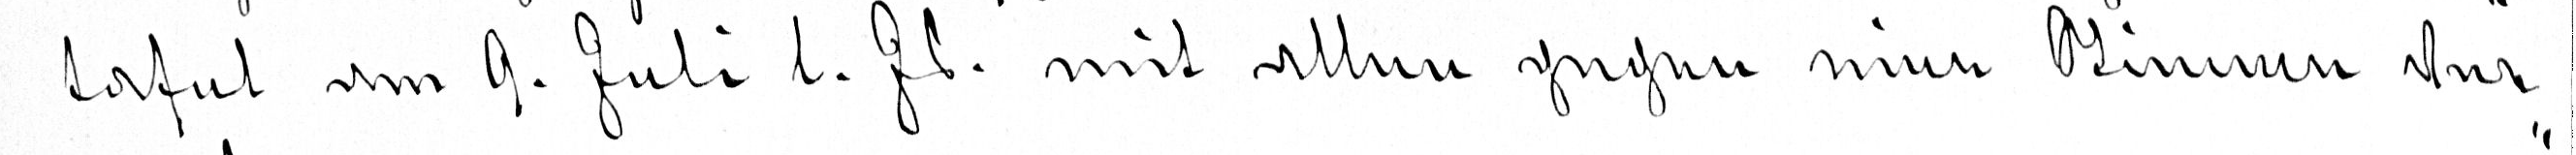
tafel am 9. Juli l. Js. mit allen gegen eine Stimme Ver¬
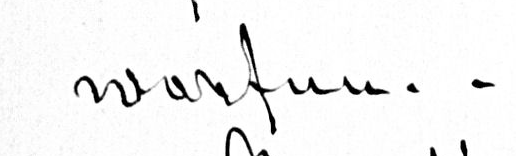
worfen.-
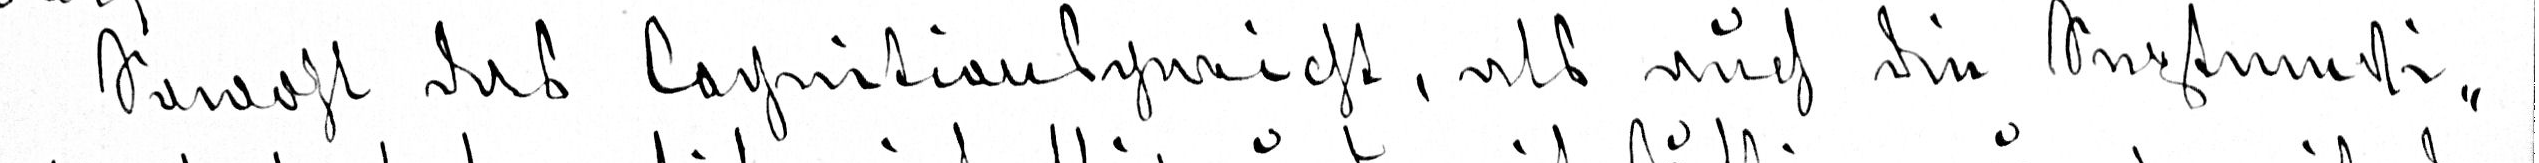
Sowohl das Cognitionsgericht, als auch die Septemvi¬
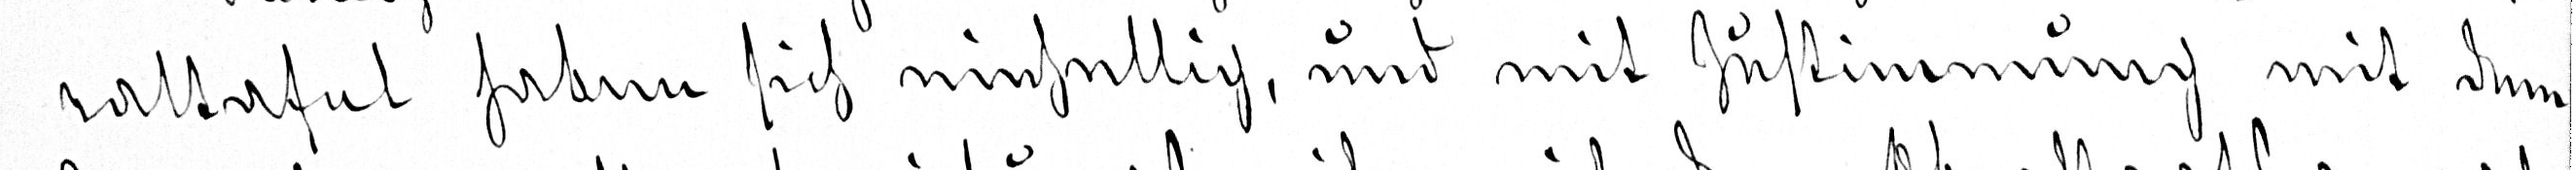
raltafel haben sich einhellig, und mit Zustimmung mit dem
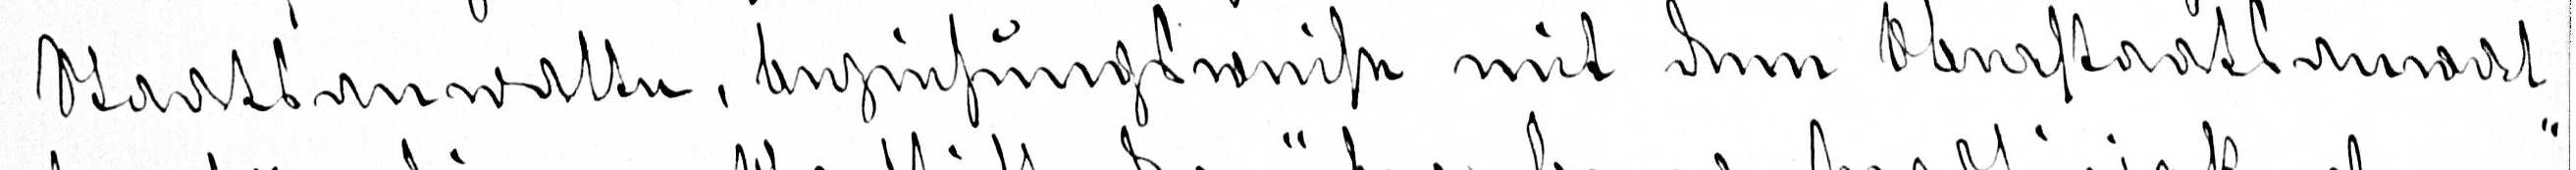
Staatsanwalte, beziehungsweise mit dem Oberstaatsanwal¬
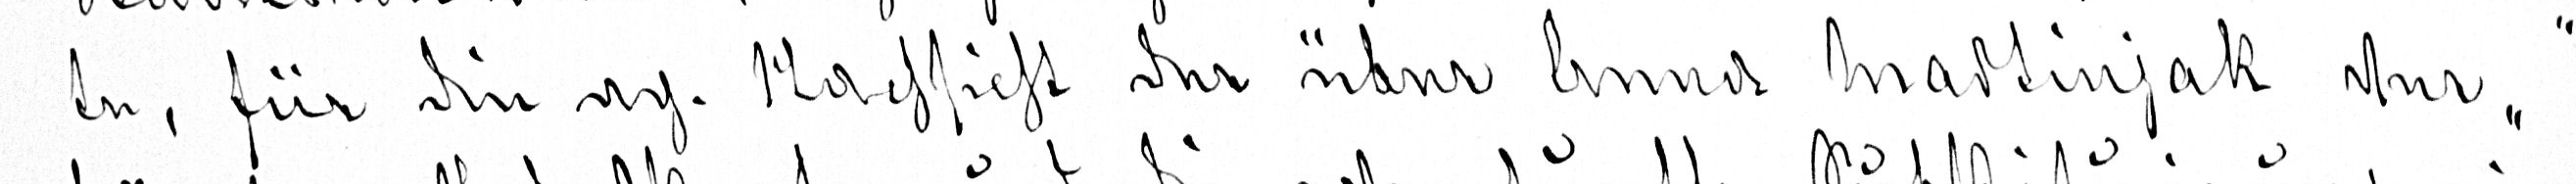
te, für die ag. Nachsicht der über Anna Martinjak Ver¬
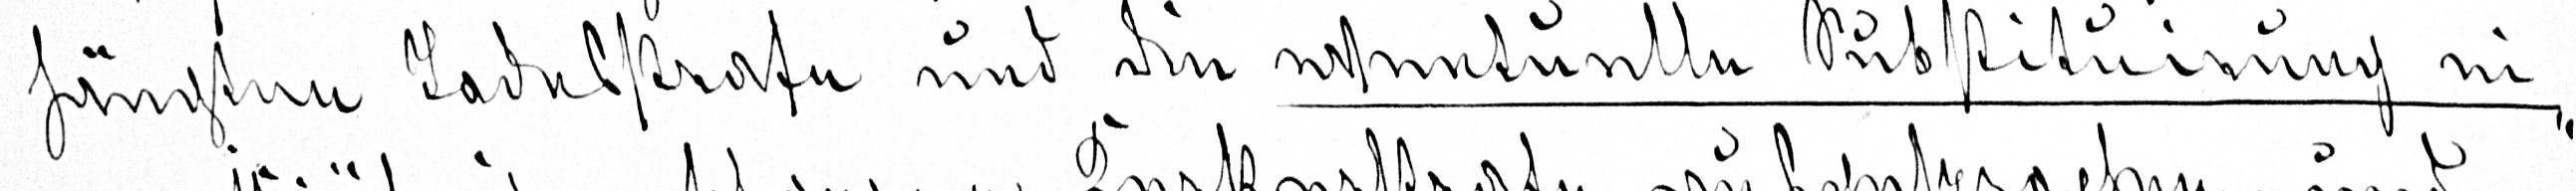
hängten Todesstrafe und die eventuelle Substituirung ei¬
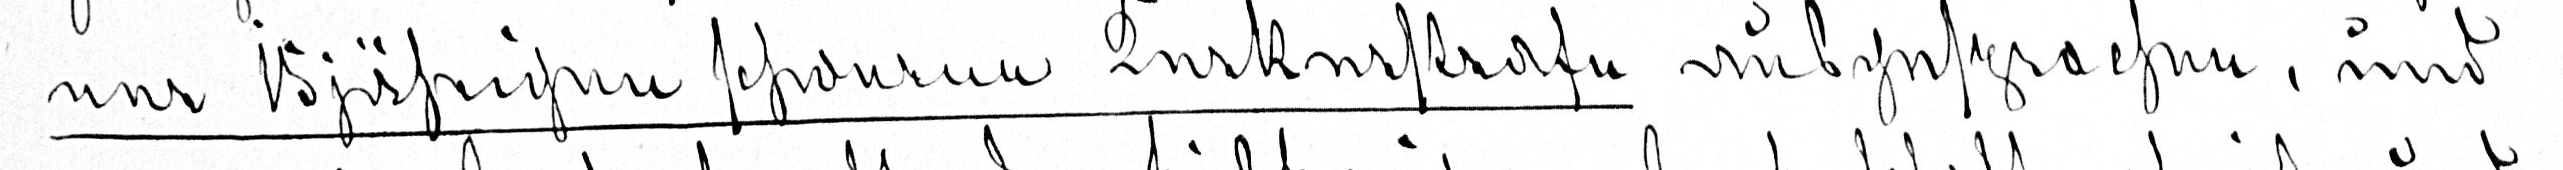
ner 15jährigen schweren Kerkerstrafe ausgesprochen, und
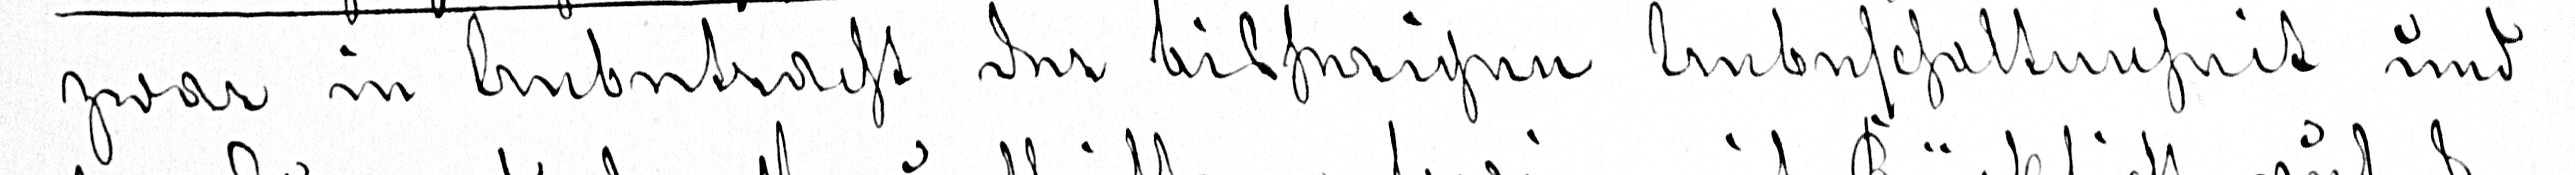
zwar in Anbetracht der bisherigen Unbescholtenheit und
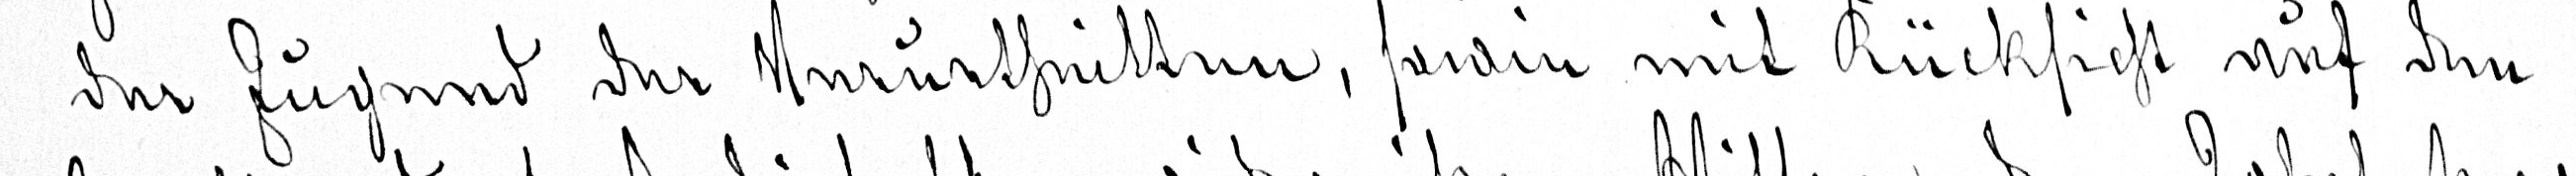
der Jugend der Verurtheilten, sowie mit Rücksicht auf den
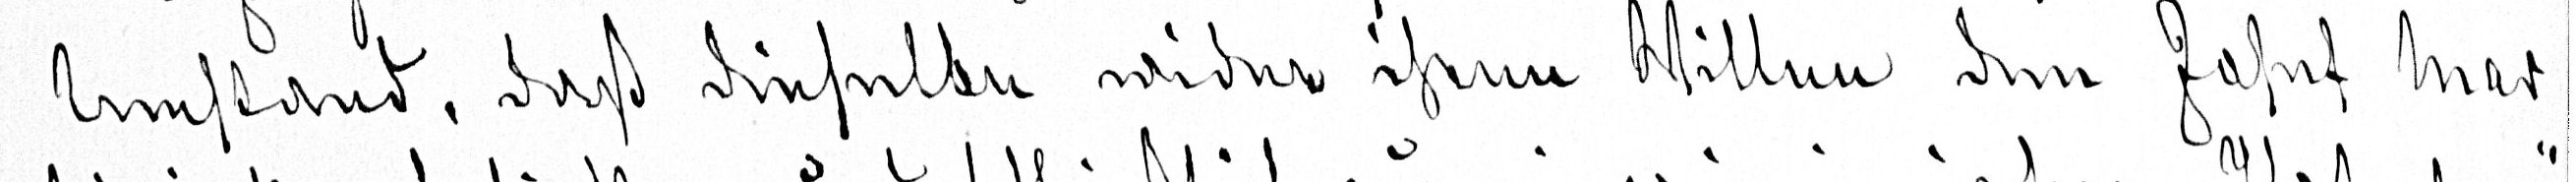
Umstand, daß dieselbe wider ihren Willen den Josef Mar¬
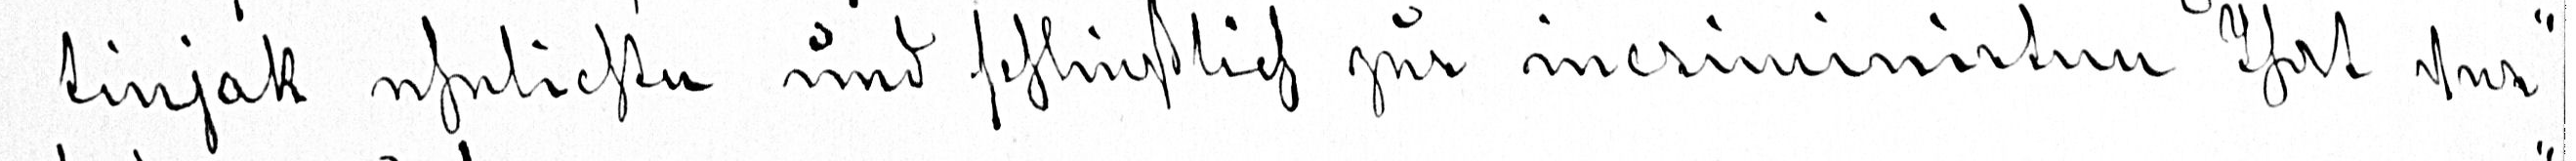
tinjak ehelichte und schließlich zur incriminirten That ver¬
